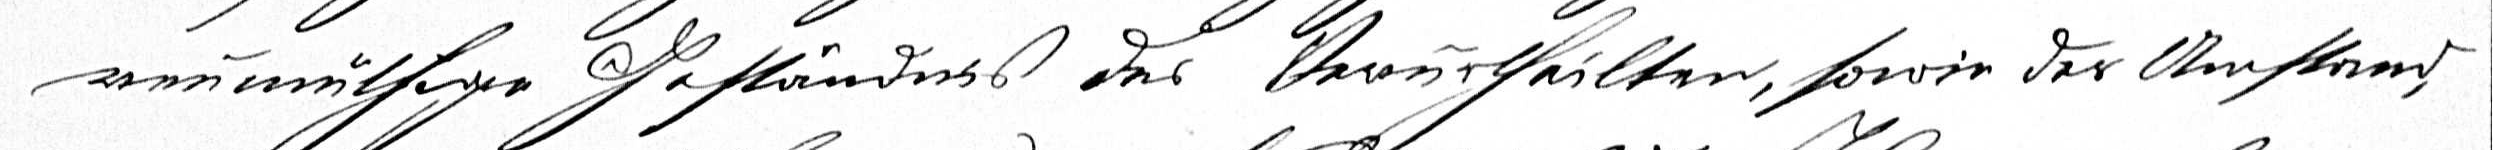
reumüthige Geständnis der Verurtheilten, sowie der Umstand,
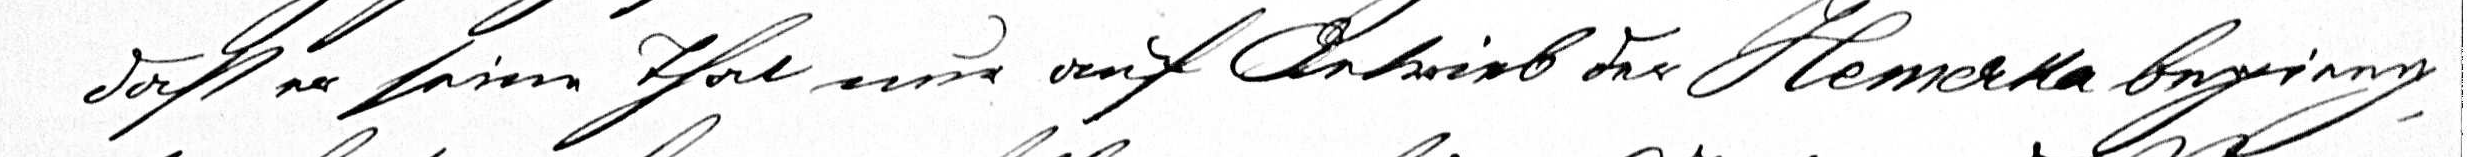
daß er seine That nur auf Antrieb der Hemerka begieng
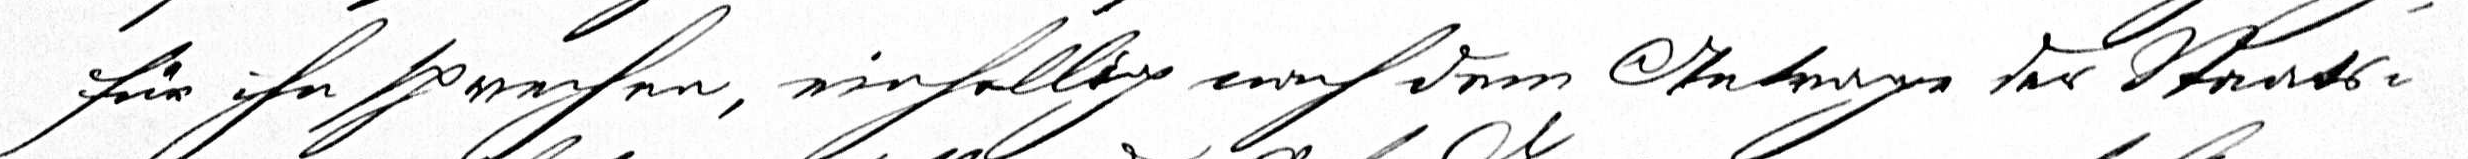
für ihn sprechen, einhellig nach dem Antrage der Staats¬
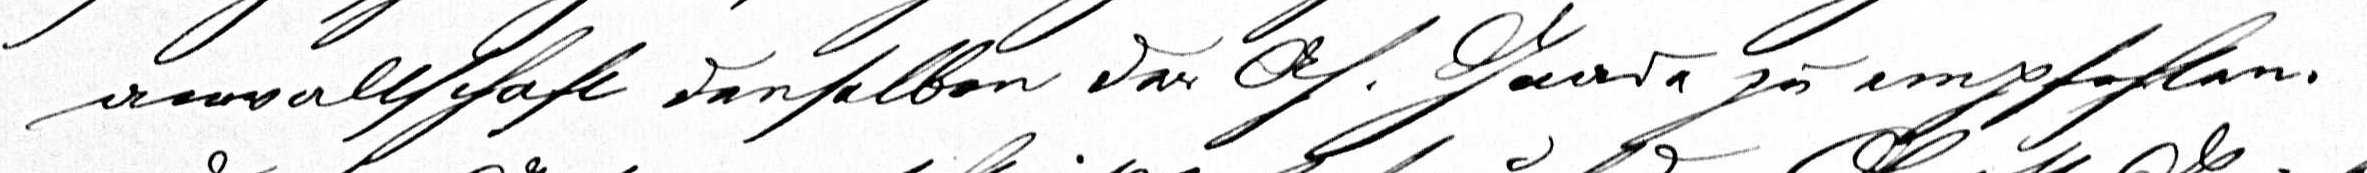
anwaltschaft denselben der Ah. Gnade zu empfehlen.
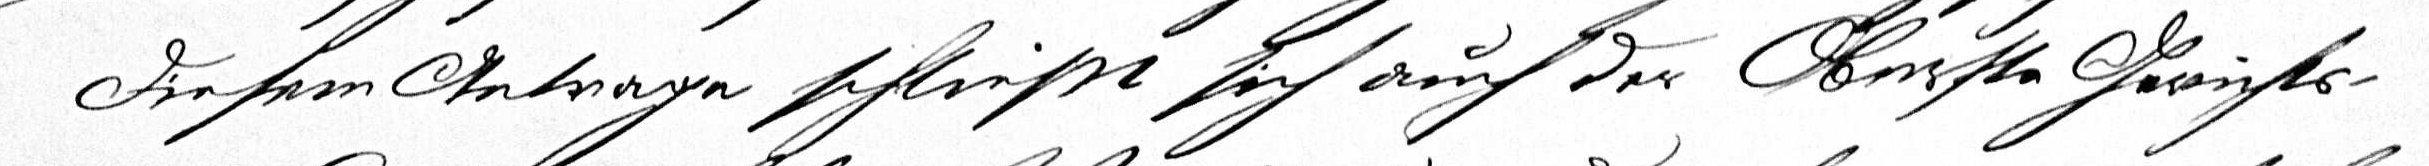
Diesem Antrage schließt sich auch der Oberste Gerichts-
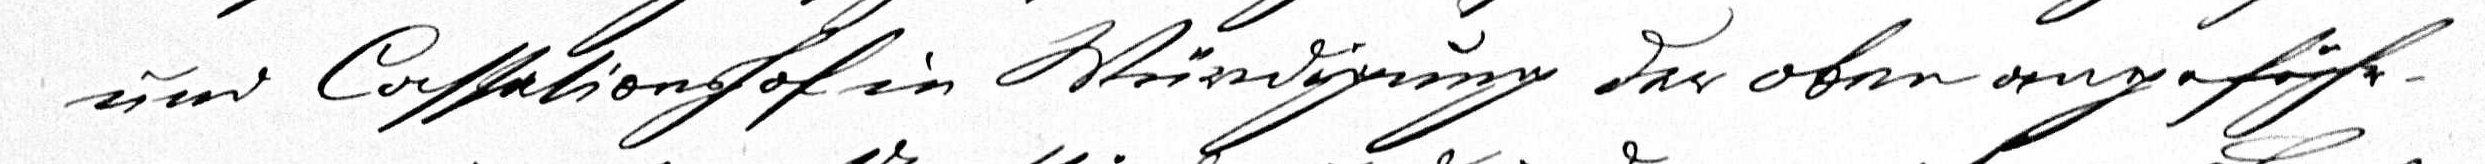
und Cassationshof in Würdigung der oben angeführ¬
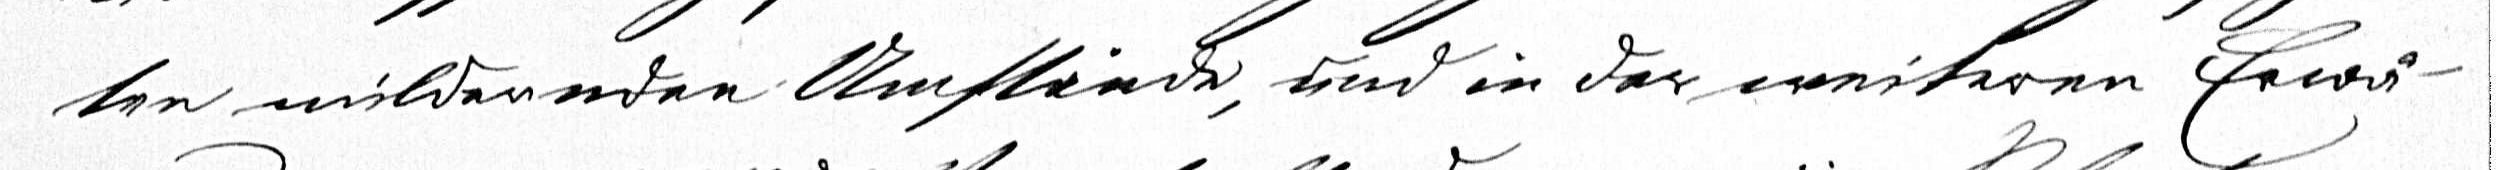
ten mildernden Umstände, und in der weiteren Erwä¬
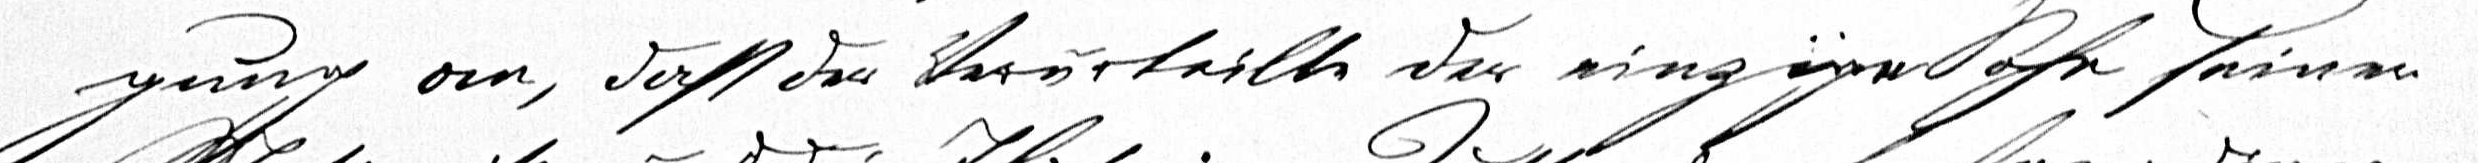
gung an, daß der Verurtheilte der einzige Sohn seiner
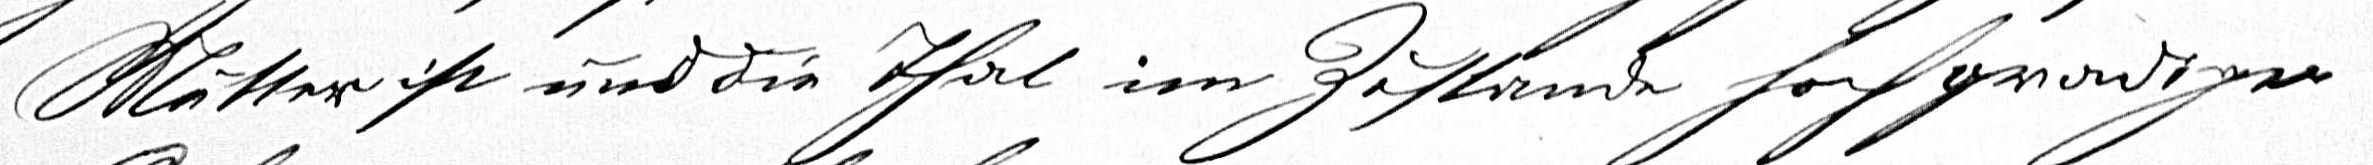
Mutter ist und die That im Zustand hochgradiger
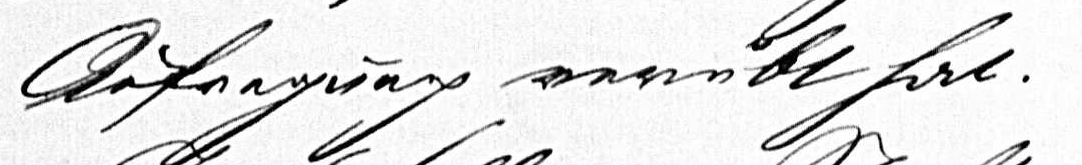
Aufregung verübt hat.
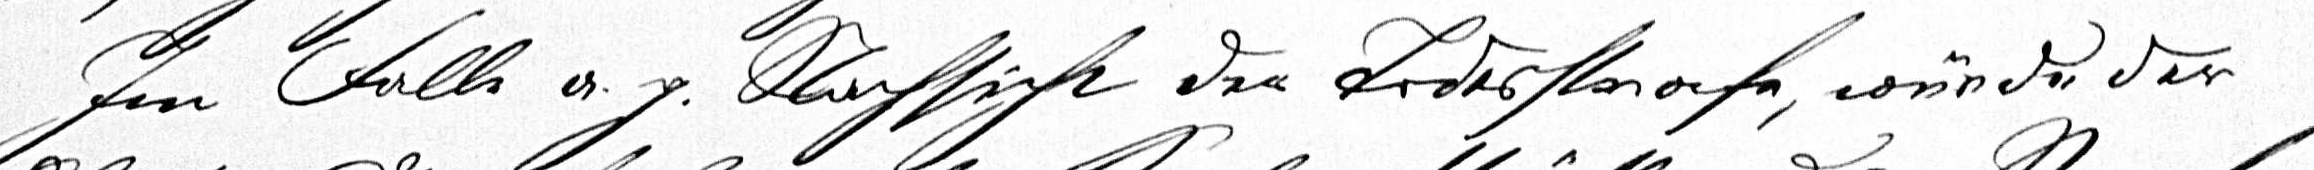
Im Falle a.g. Nachsicht der Todesstrafe, würde der
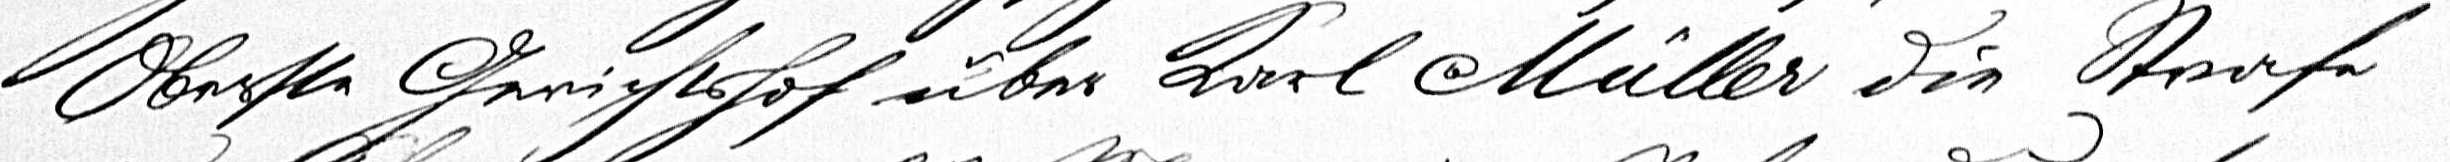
Oberste Gerichtshof über Karl Müller die Strafe
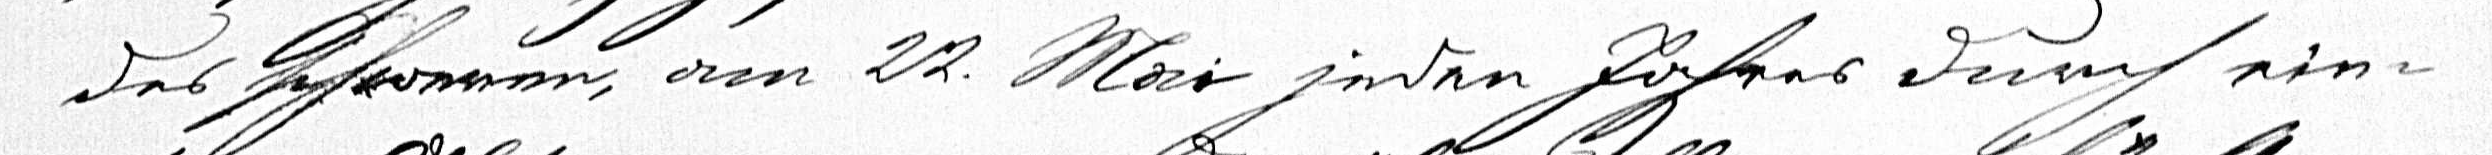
der schweren, am 22. Mai jeden Jahres durch ein¬
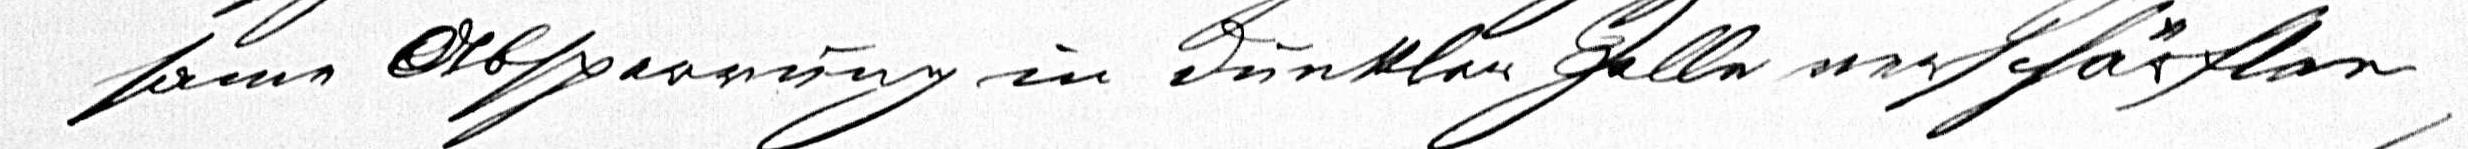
same Absperrung in dunkler Zelle verschärften
